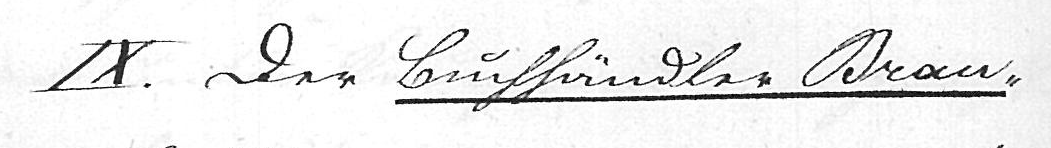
IX. Der Buchhändler Brau-
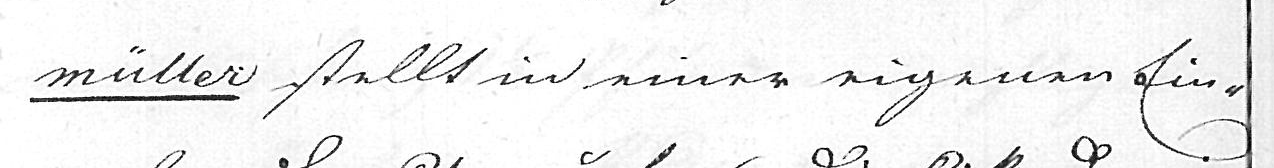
müller stellt in einer eigenen Ein-
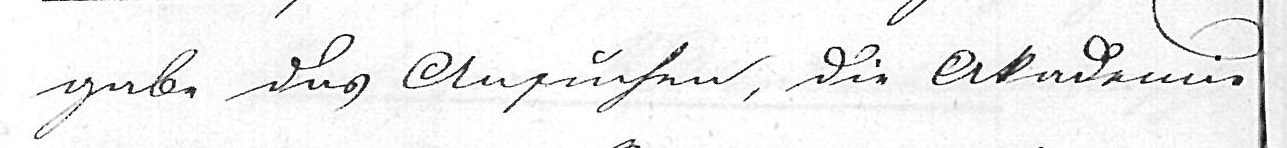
gabe das Ansuchen, die Akademie
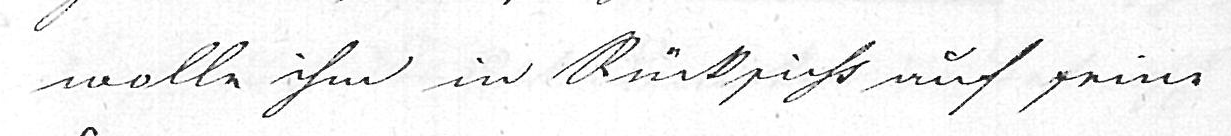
wolle ihm in Rücksicht auf seine
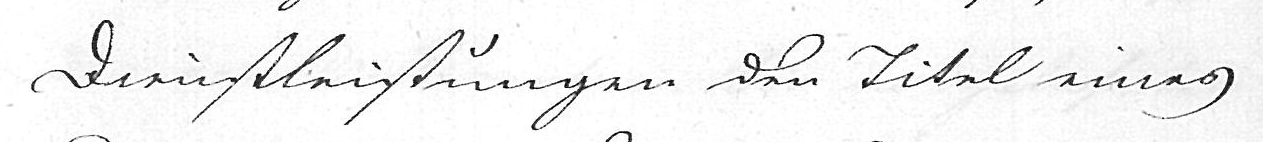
Dienstleistungen den Titel eines
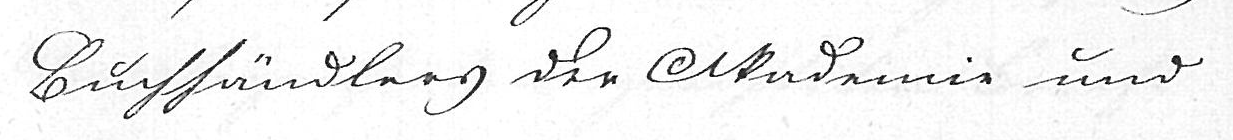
Buchhändlers der Akademie und
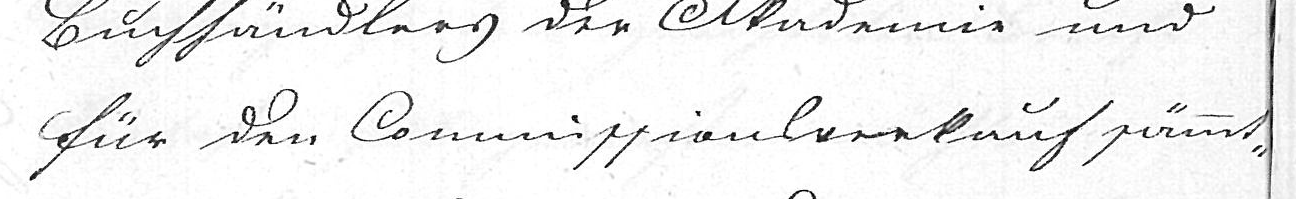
für den Commissionsverkauf sämmt-
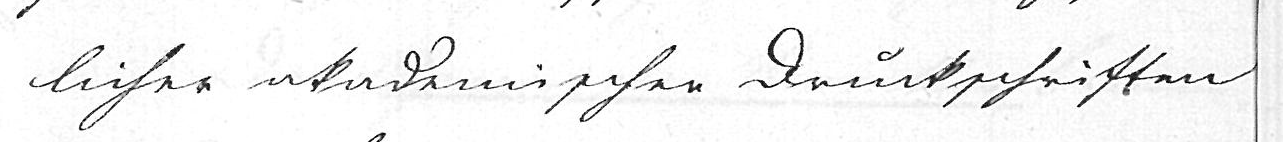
licher akademischen Druckschriften
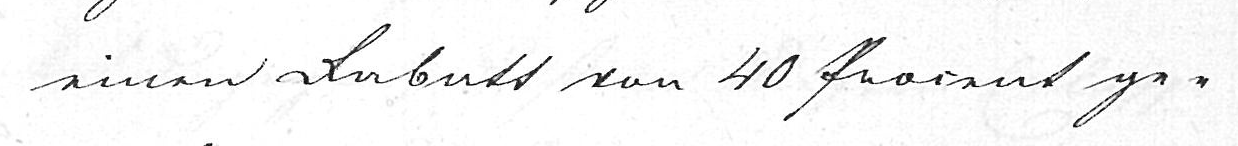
einen Rabatt von 40 Procent ge-
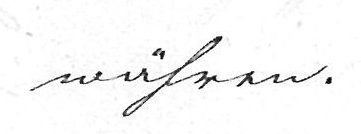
währen.
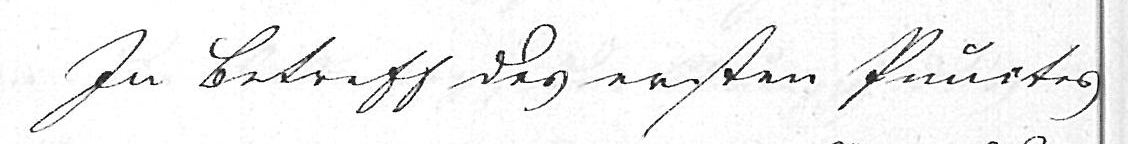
In Betreff des ersten Punctes
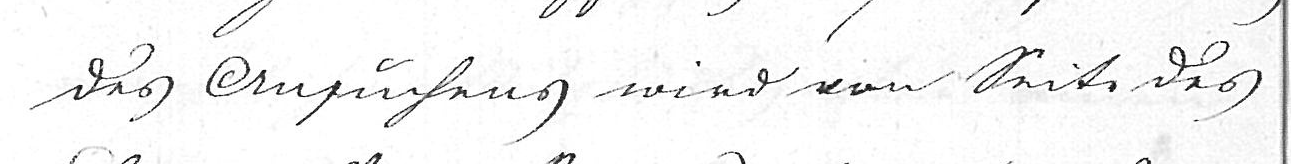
des Ansuchen wird von Seite des
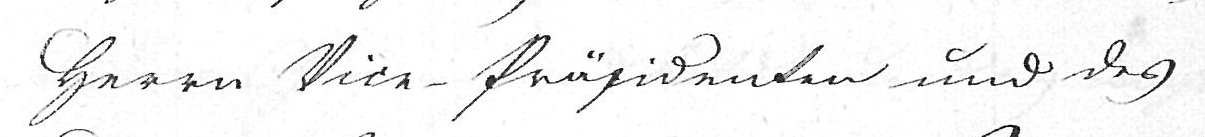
Herrn Vice-Präsidenten und des
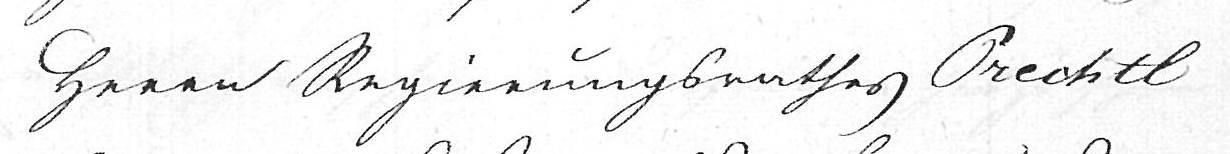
Herrn Regierungsrathes Prechtl
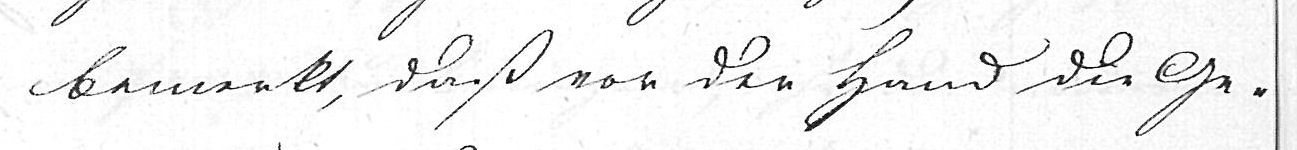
bemerkt, daß vor der Hand der Ge-
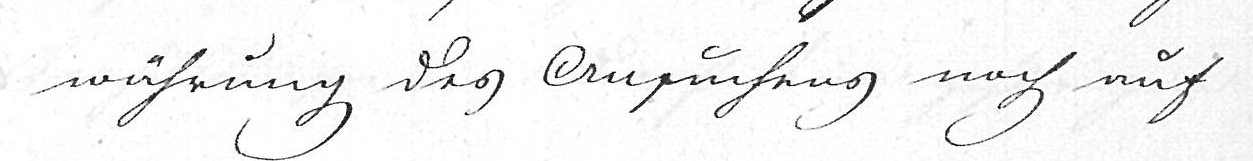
währung des Ansuchens noch auf
